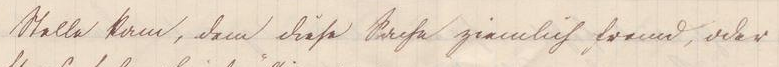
Stelle kam, dem diese Sache ziemlich fremd, oder
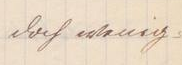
doch wenig-
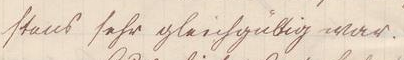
stens sehr gleichgültig war.
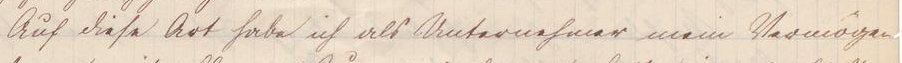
Auf diese Art habe ich als Unternehmer mein Vermögen
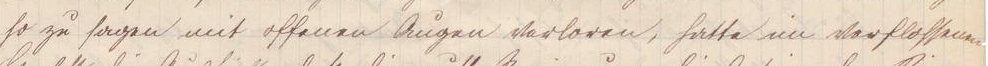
so zu sagen mit offenen Augen verloren, hatte im verflossenen
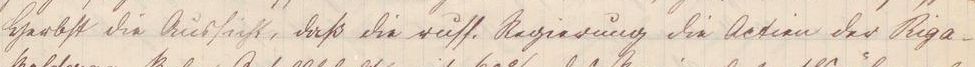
Herbst die Aussicht, daß die russ. Regierung die Actien der Riga-
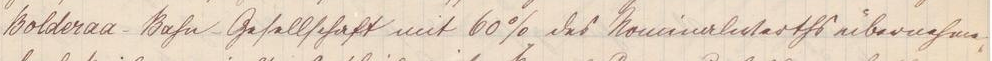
Boderaa-Bahn-Gesellschaft mit 60% des Nominalwerths übernehme,
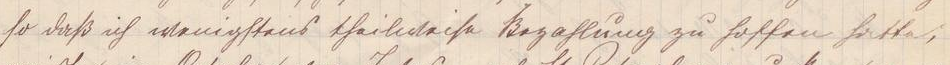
so daß ich wenigstens theilweise Bezahlung zu hoffen hatte;
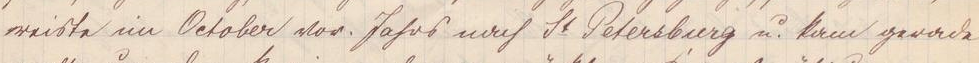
reiste im October vor. Jahrs nachSt Petersburg u. kam gerade
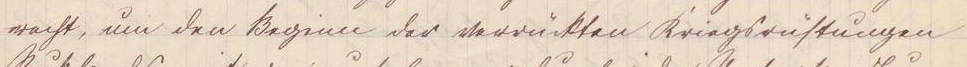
recht, um den Beginn der verrückten Kriegsrüstungen
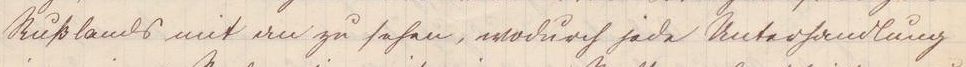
Rußlands mit an zu sehen, wodurch jede Unterhandlung
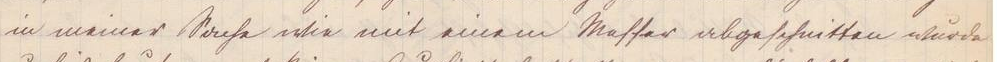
in meiner Sache wie mit einem Messer abgeschnitten wurde
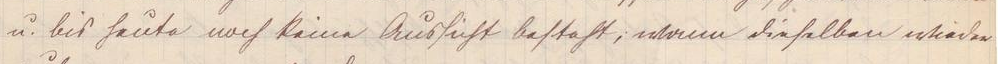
u. bis heute noch keine Aussicht besteht, wann dieselben wieder
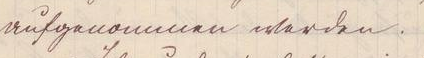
aufgenommen werden.
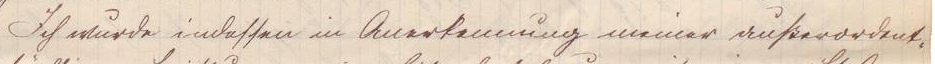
Ich wurde indessen in Anerkennung meiner außerordent-
